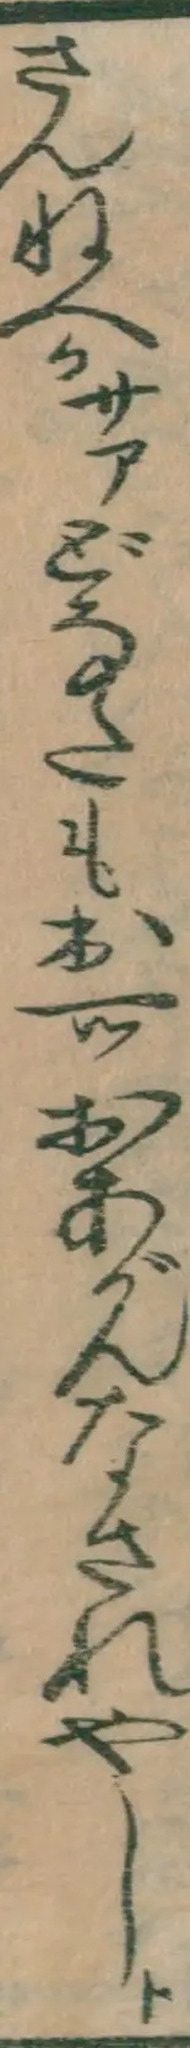さんねへかサアどなたもお一ツおあがんなされやしト

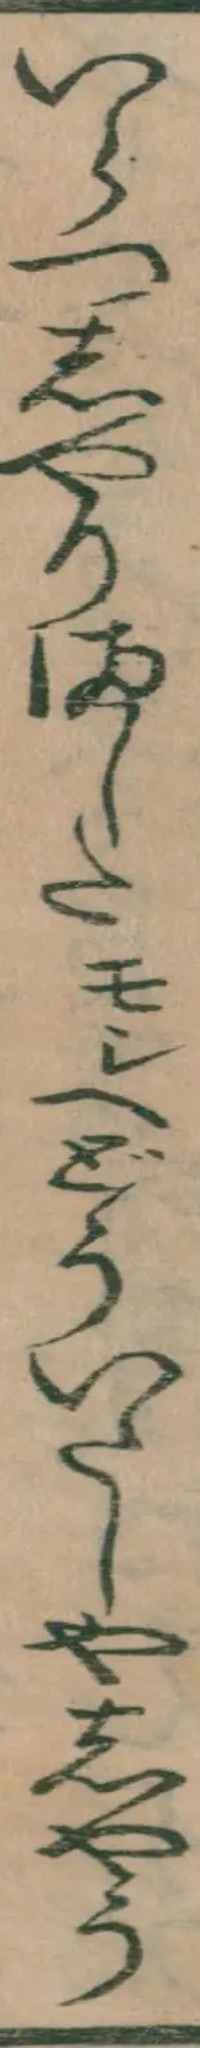いらつしやりましたモシへどういたしやしやう
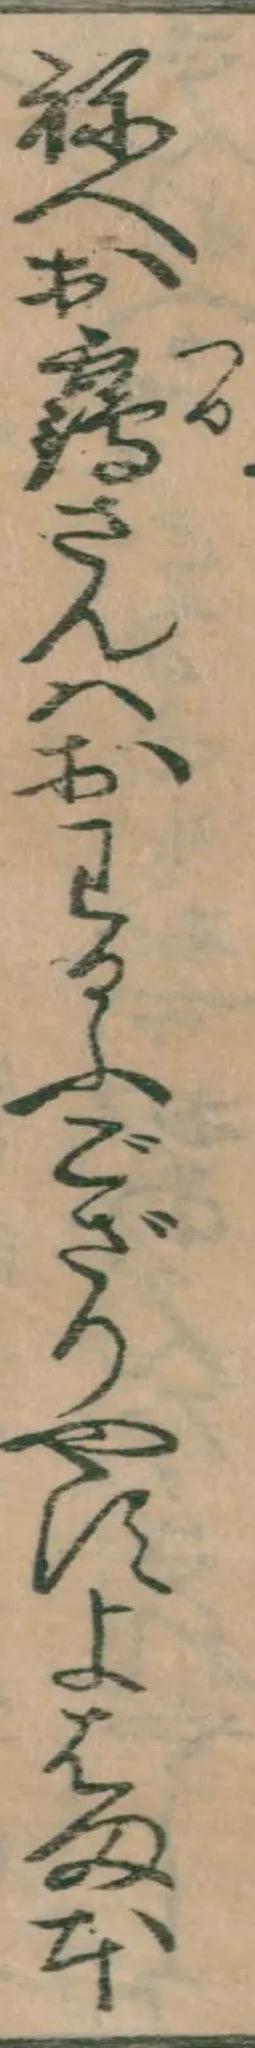ねへお鶴さんはおわるふござりやすよはま本
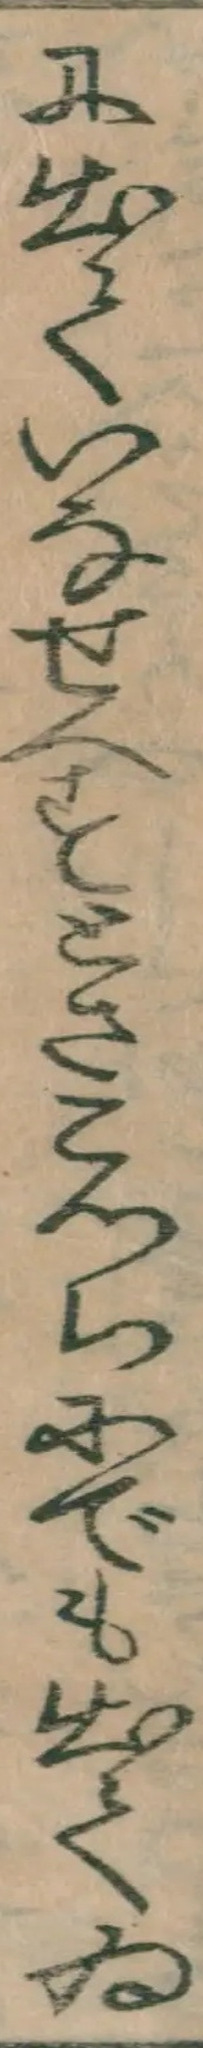に出ていなせへすとさこつらにでも出てゐ
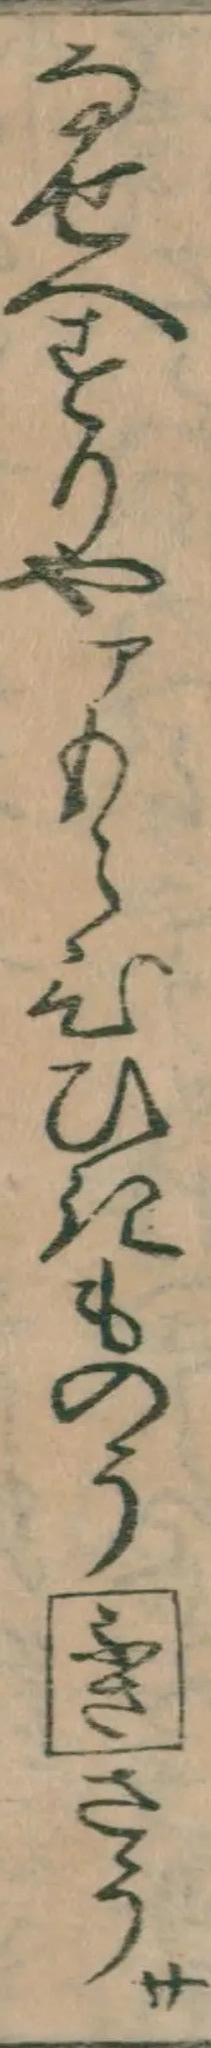なせへすりやァもらひひきものう〈ふき〉さうサ
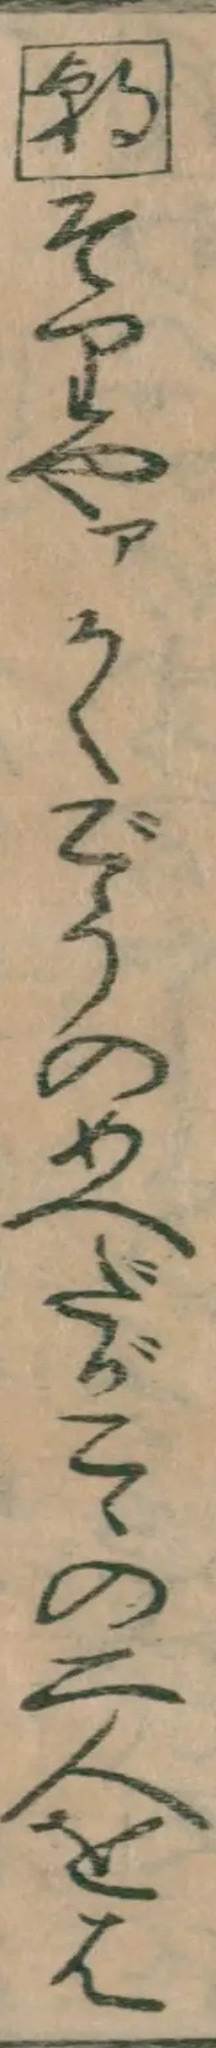〈朝〉そりやァかくごうのめへだがこゝの二人をは
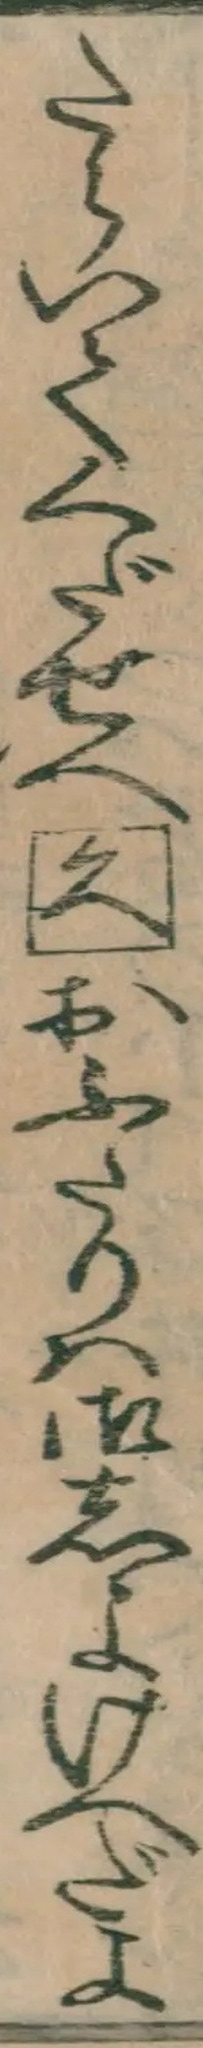たらいてくだせへ〈久〉おふたりは御しよけへだよ
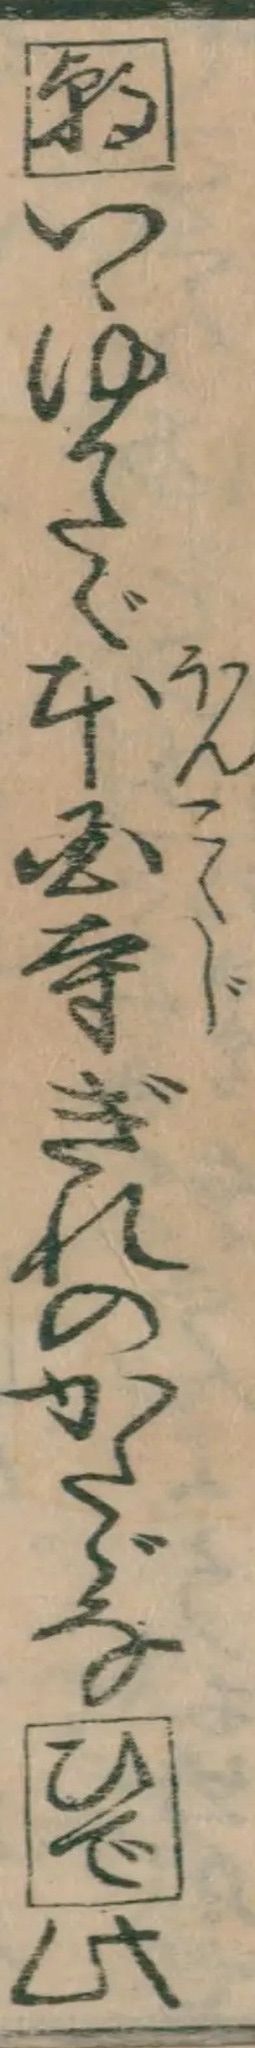〈朝〉いゝゆかたゞ本国寺ぎれのかたゞな〈ひで〉此
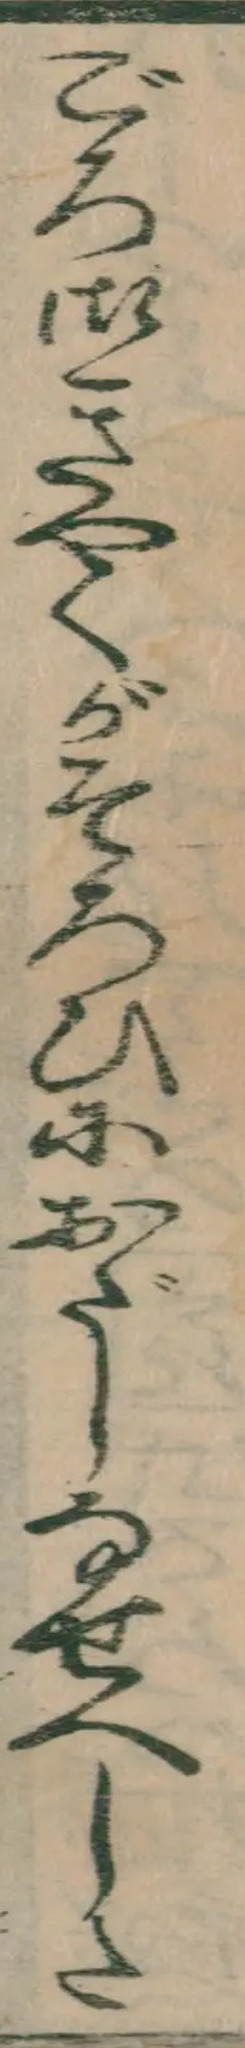ごろ御きやくがそろひにおだしなせへした
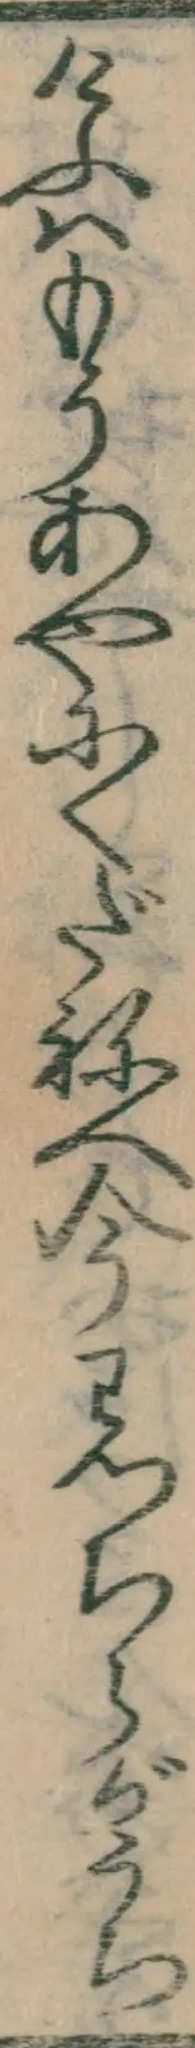けふはもうあやにくだねへ今わつちらがうち
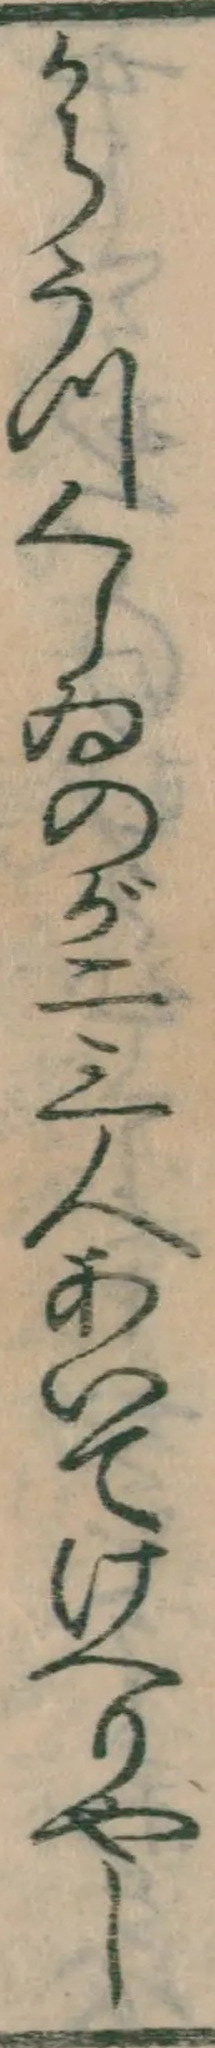からうつくしゐのが二三人あいてけへりやし
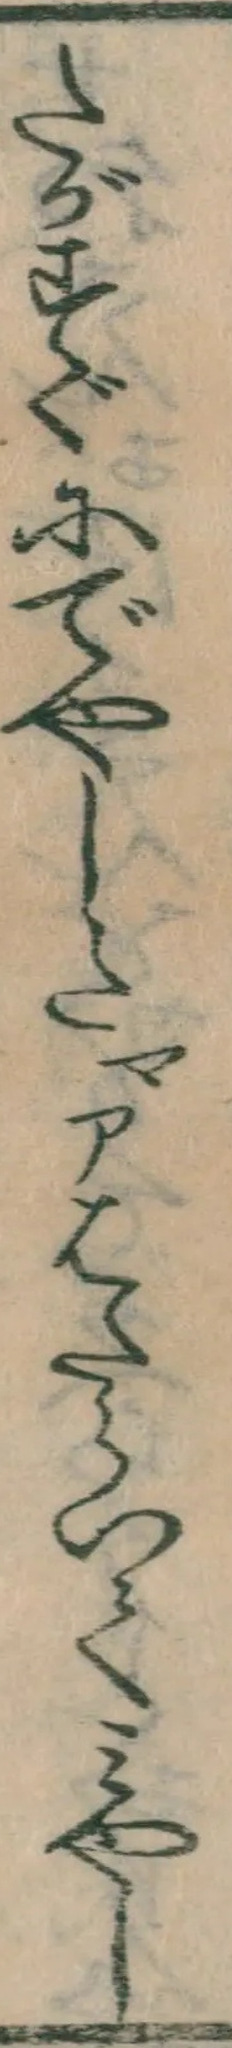たがすぐにでやしたマアはたらいてみやし
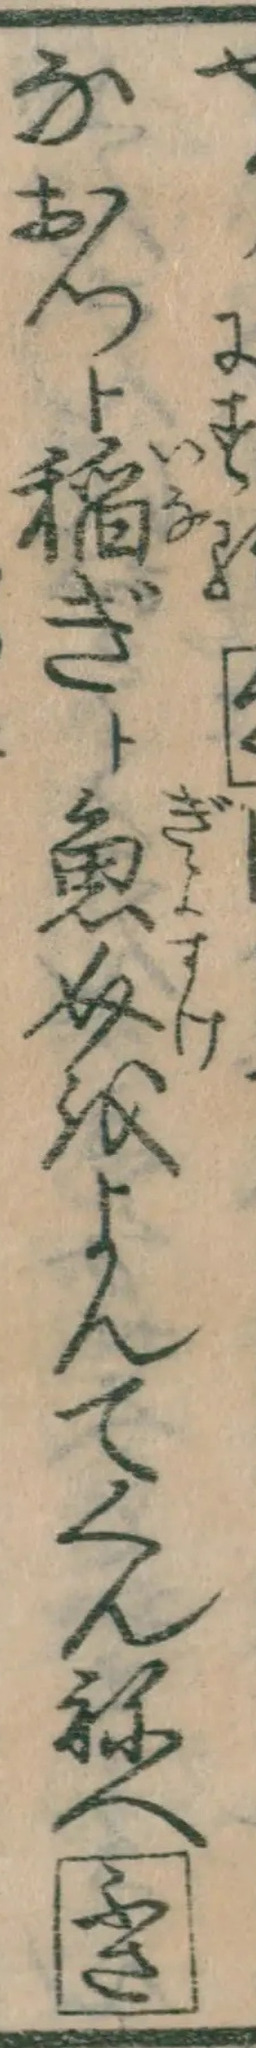なおつと稲ぎと魚介をよんてくんねへ〈ふさ〉
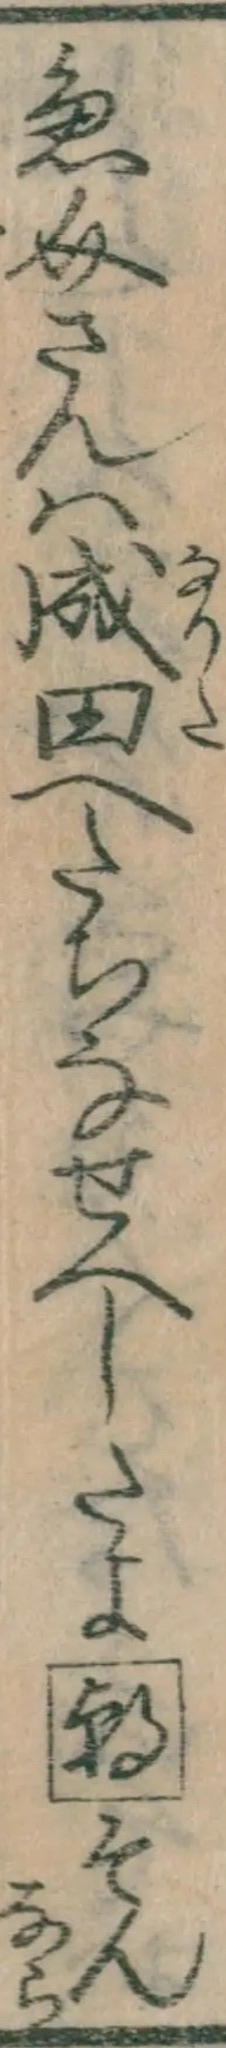魚介さんは成田へたちなせへしたよ〈朝〉そんなら
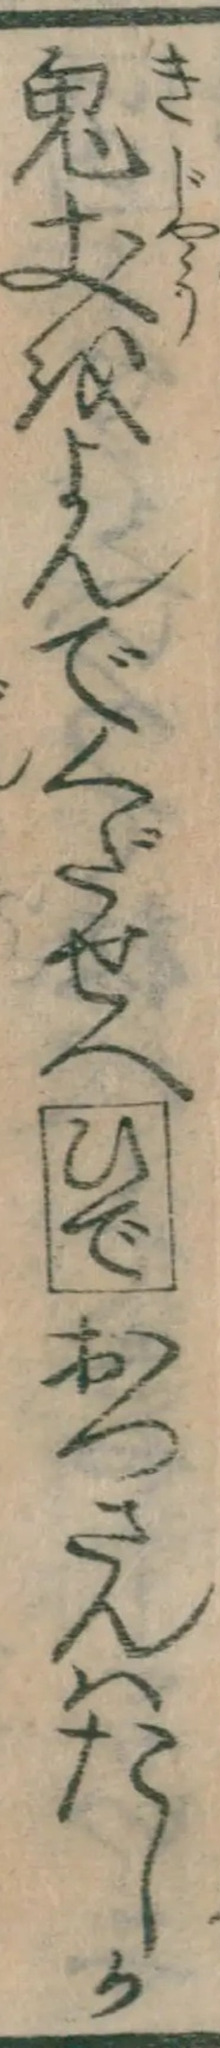鬼丈をよんでくだせへ〈ひで〉おつさんはたしか
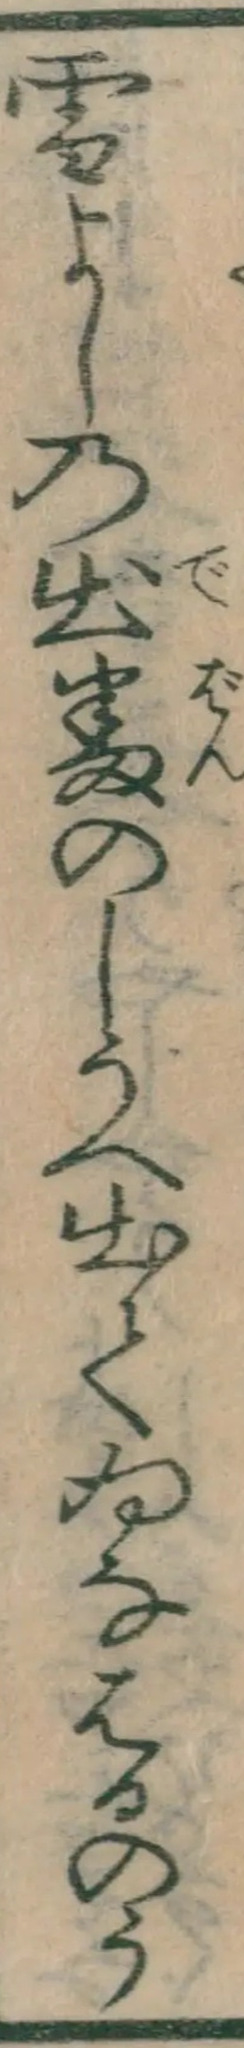雪よしの出番のしうへ出てゐなはるのう
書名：教訓読本：大礒風俗仕懸文庫
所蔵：国立国会図書館 National Diet Library, JAPAN
